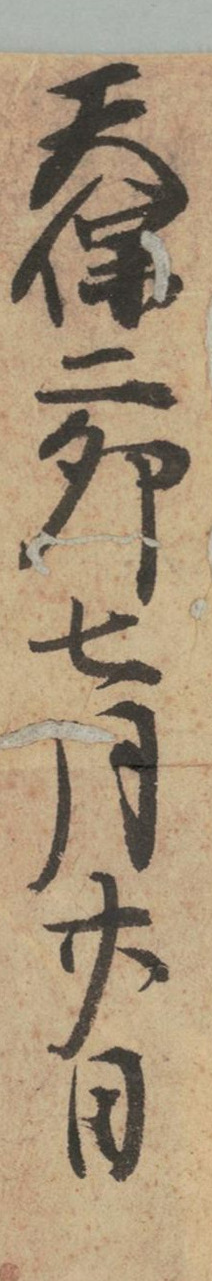天保二卯七月廿日
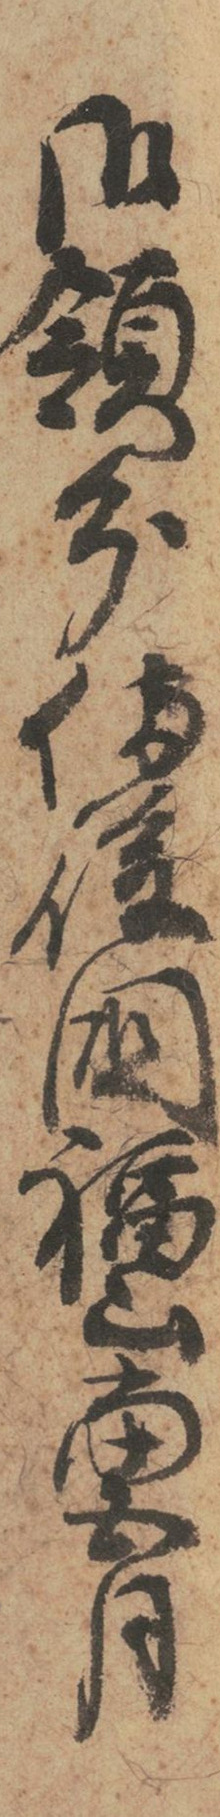御領分備後国福山当五月
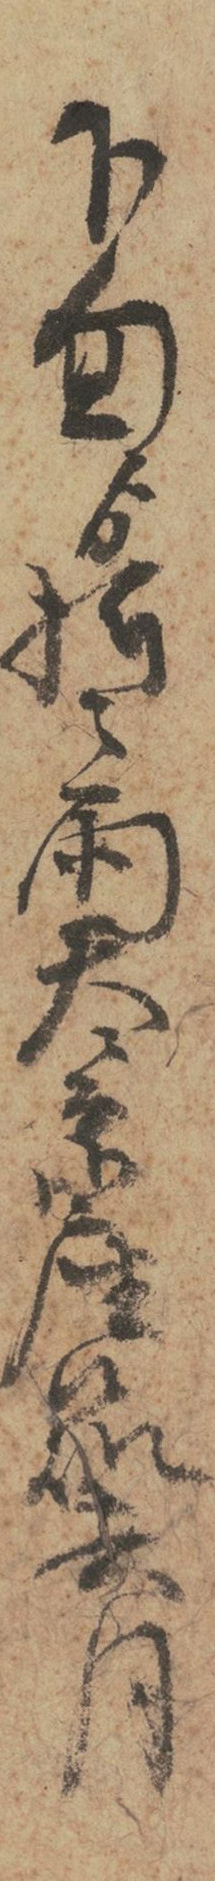下旬ゟ折々雨天ニ而御座候処去月
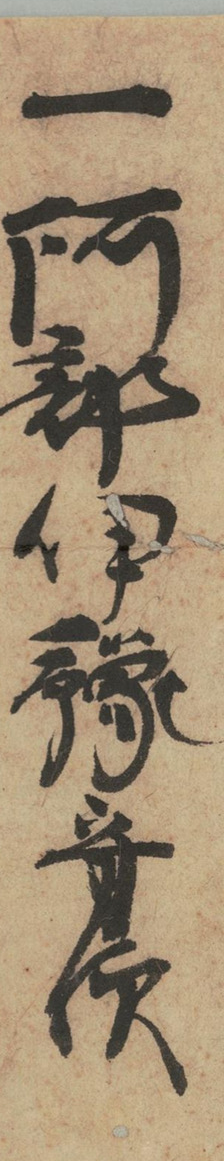一阿部伊豫守様
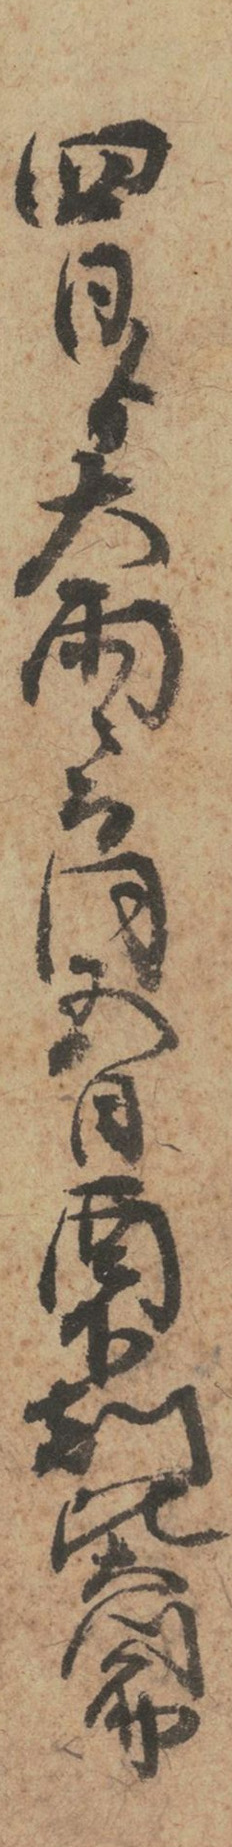四日ゟ大雨二而同五日酉下刻比大川筋
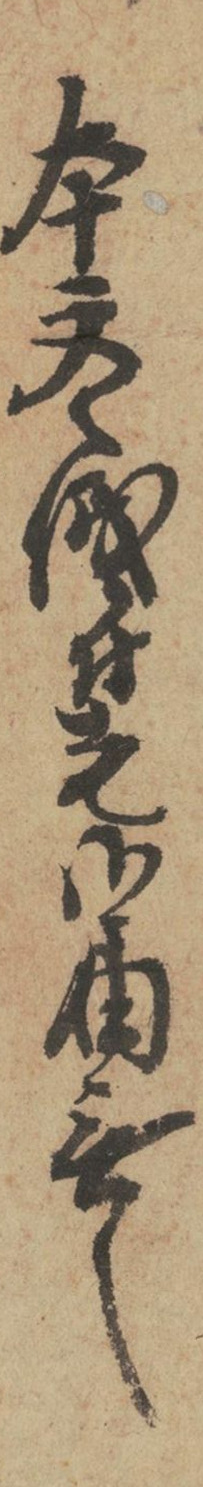本文之儀二付先御届無之
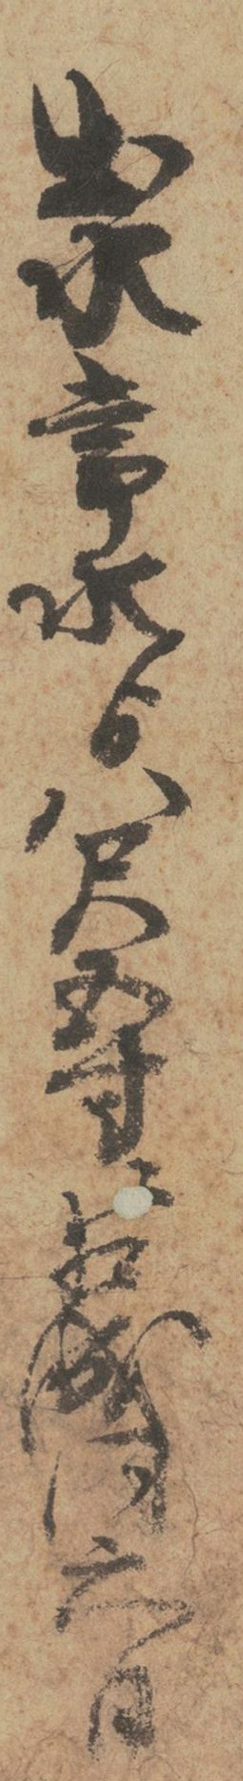出水常水ゟ八尺五寸二相成同六日
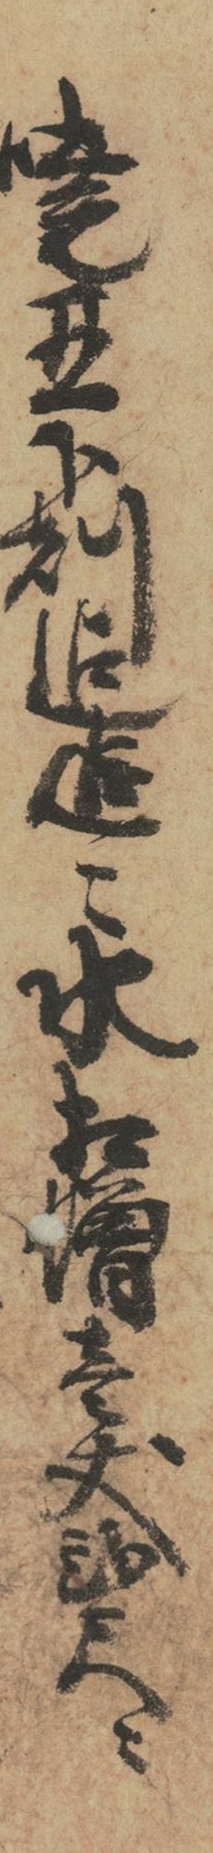暁丑下刻迄追々水相増壱丈弐尺二
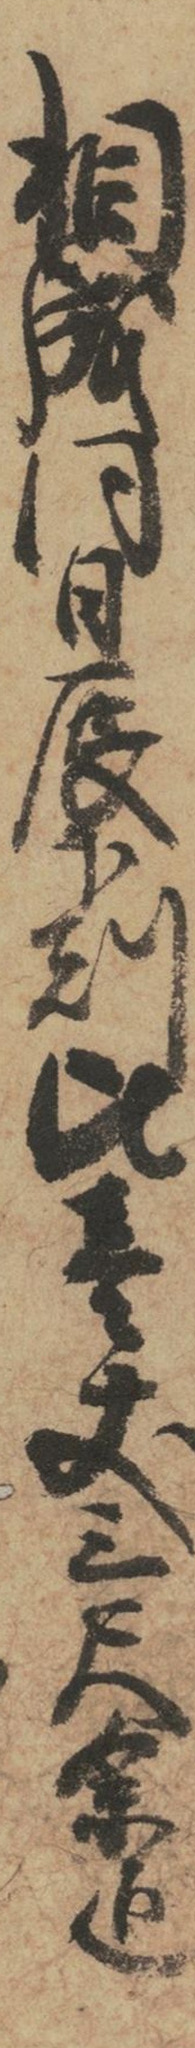相成同日辰下刻比壱丈三尺余迄
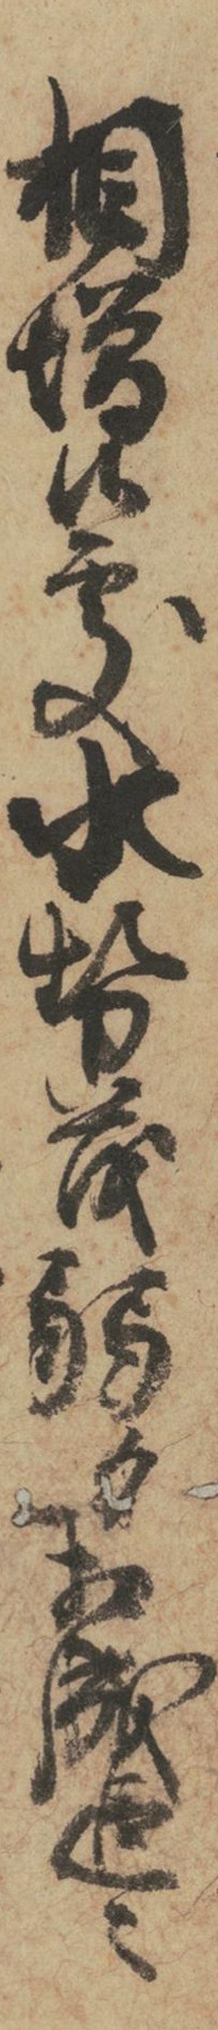相増候処水勢も弱く相成追々
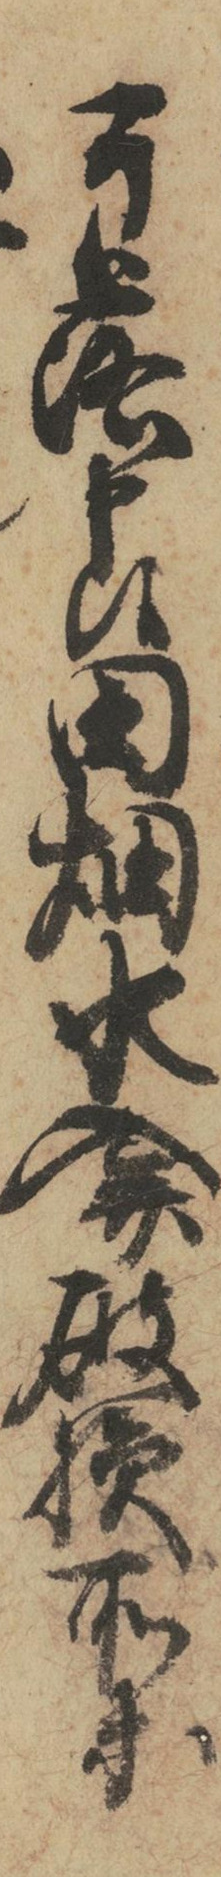可上洛申候田畑水入并破損所等
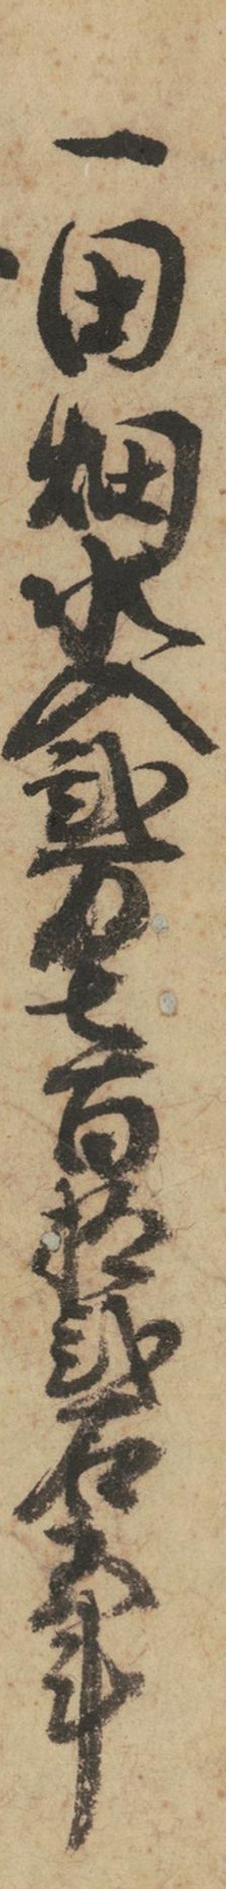一田畑水入弐万七百拾弐石五斗
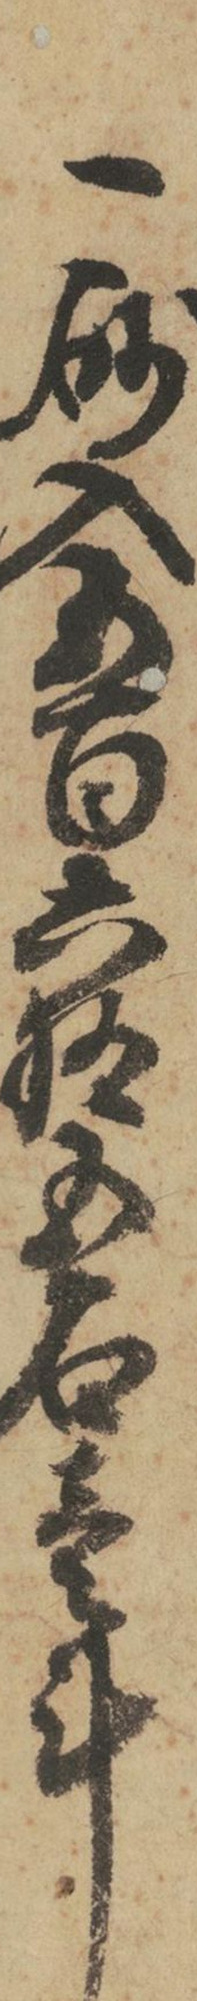一砂入五百六拾五石壱斗
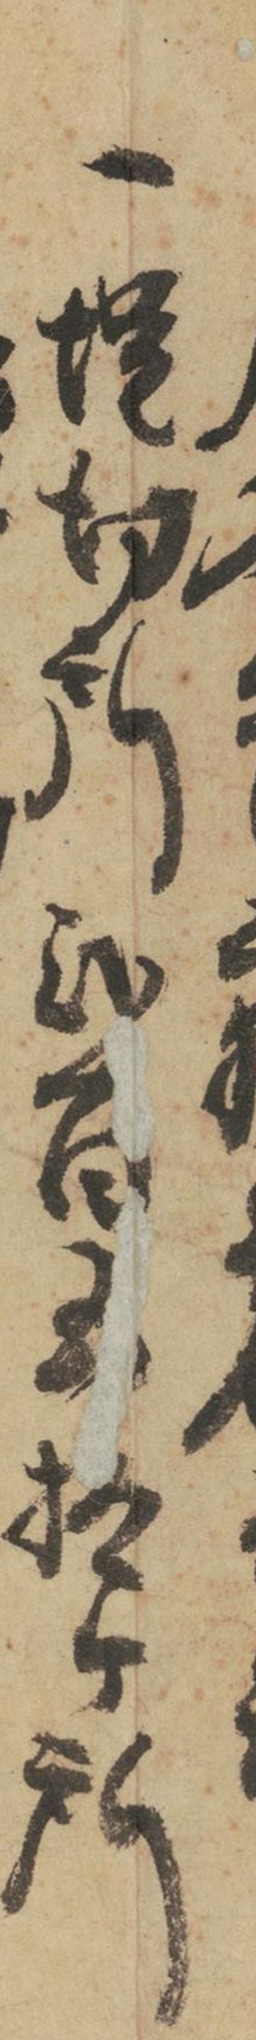一提切所弐百五拾ヶ所
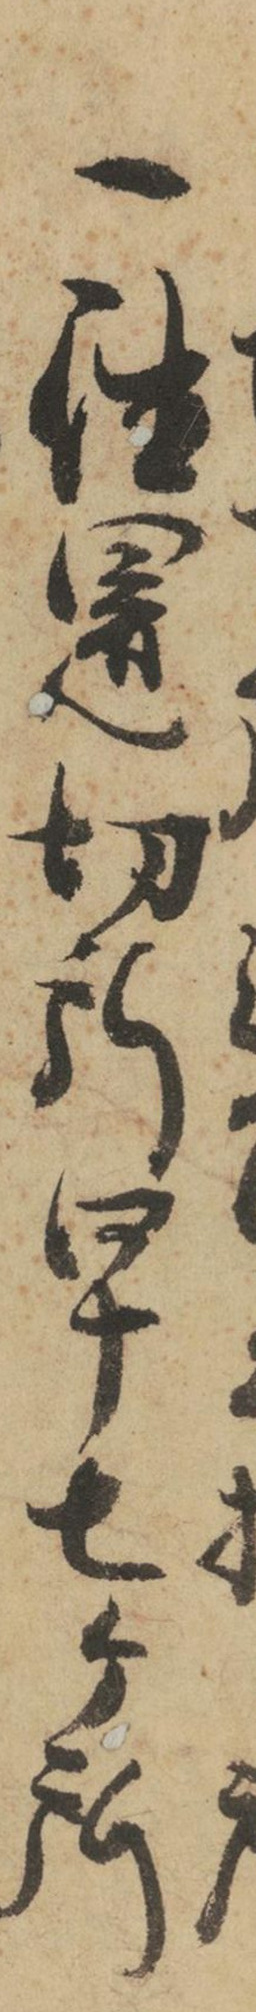一往還切所四十七ヶ所
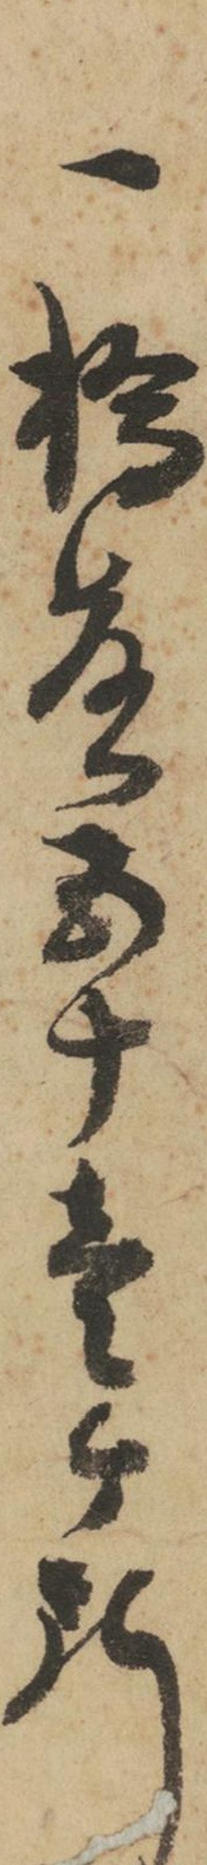一橋落五十壱ヶ所
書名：[紀州藩災害記録]
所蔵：東京大学地震研究所図書室 Earthquake Research Institute Library, The University of Tokyo, JAPAN
